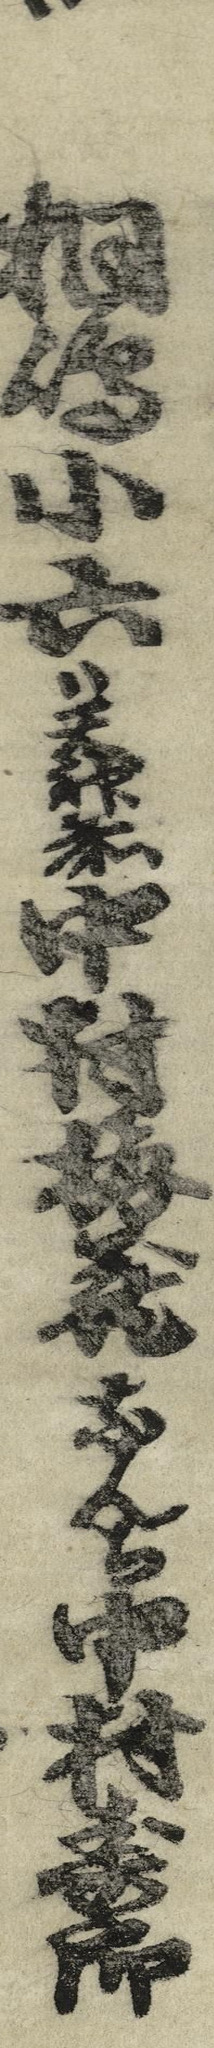〃相嶋小六〃天神前中村梅蔵なんち中村寿郎
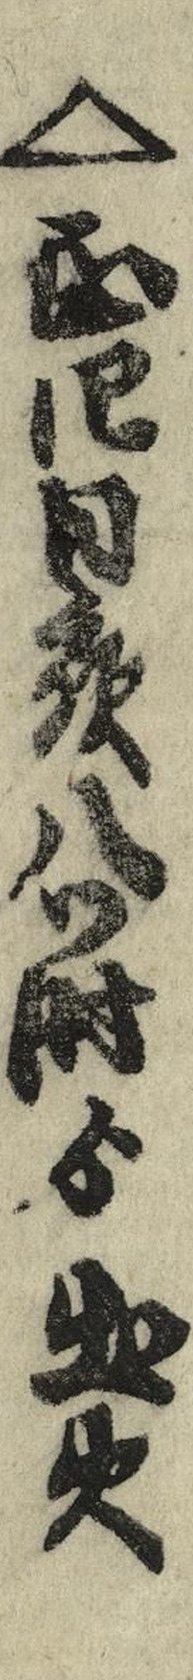△盆四日夜八ツ時ゟ出火
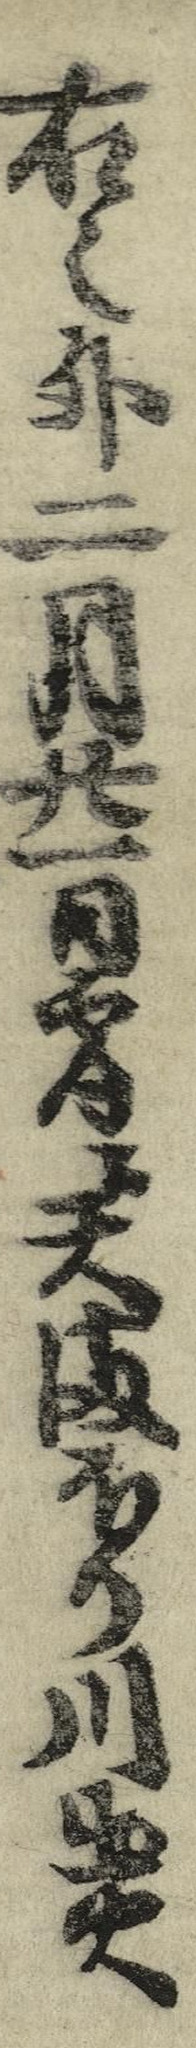右之外二月廿一日宵に天満ほり川出火
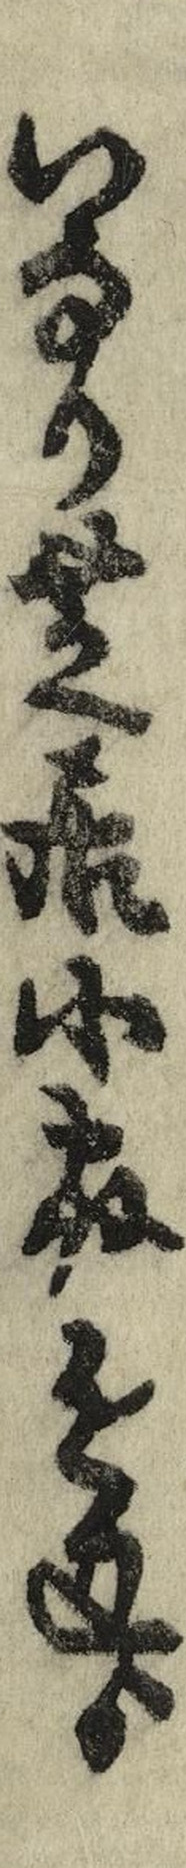いなり芝居小敷近辺ゟ
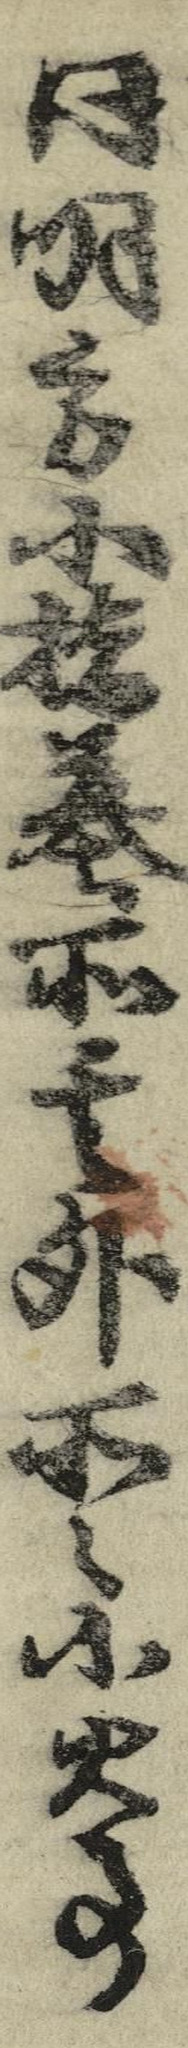同明方小橋墓所其外所々小火事
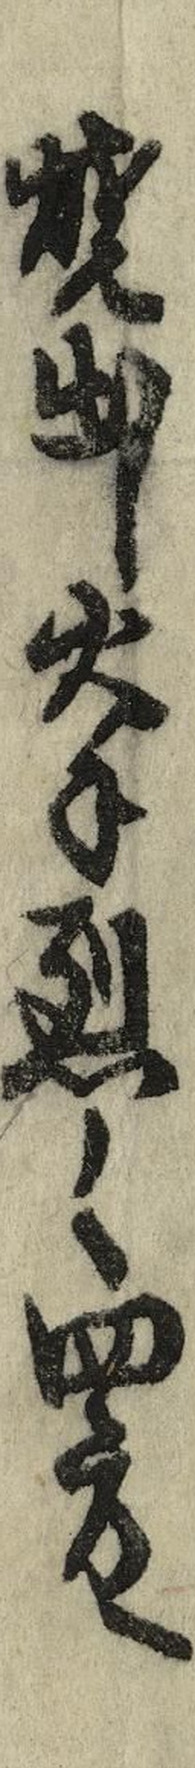焼出し火手烈く四方へ
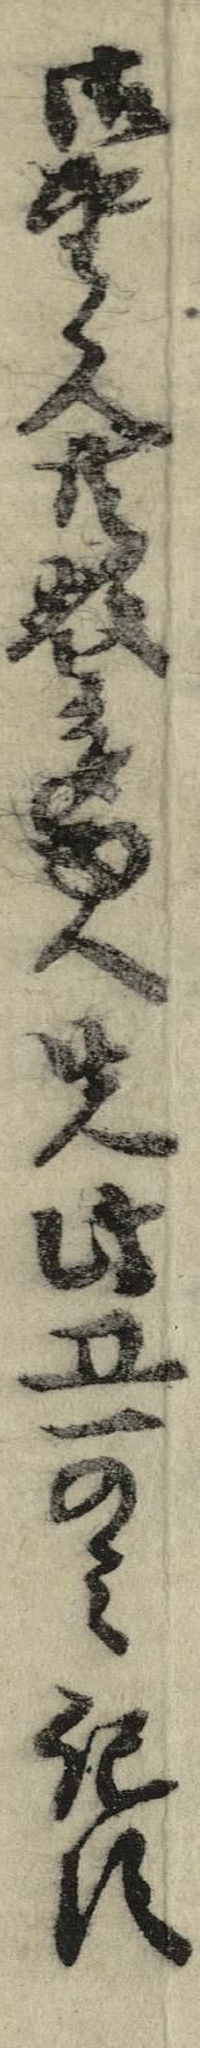御望て人共数多ゆへ先此辺のみ記す
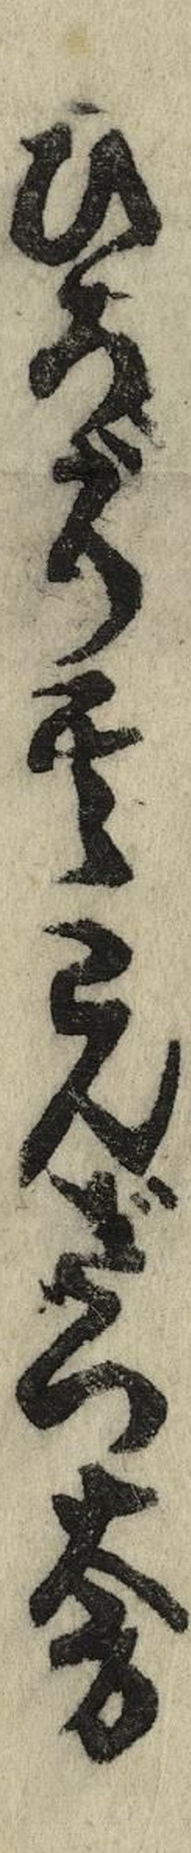ひろがり其こんざつ大方
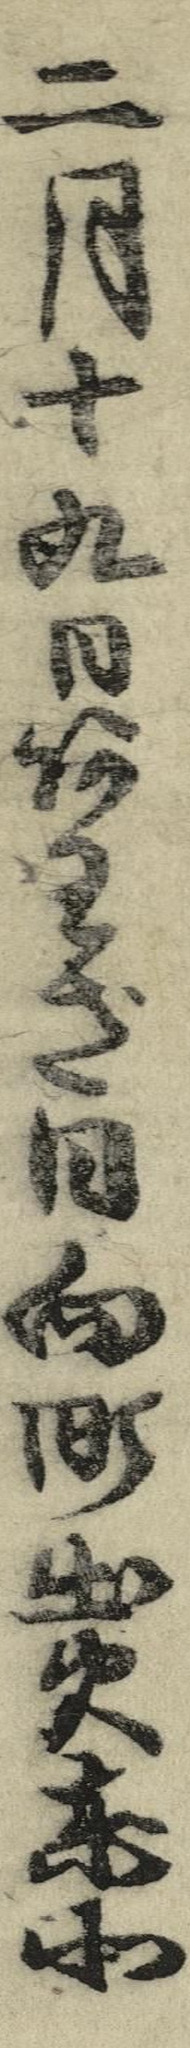二月十九日あわざ日向町出火東北
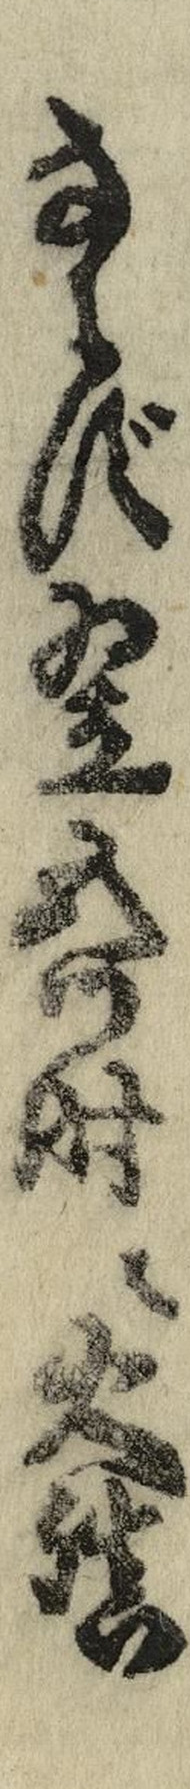ならず翌五ツ時に火鎮
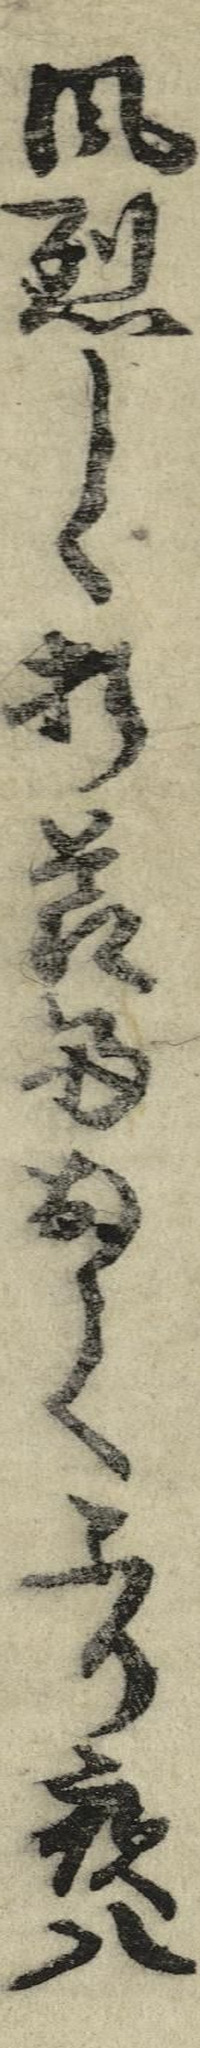風烈しく折節雨故しくふり夜八
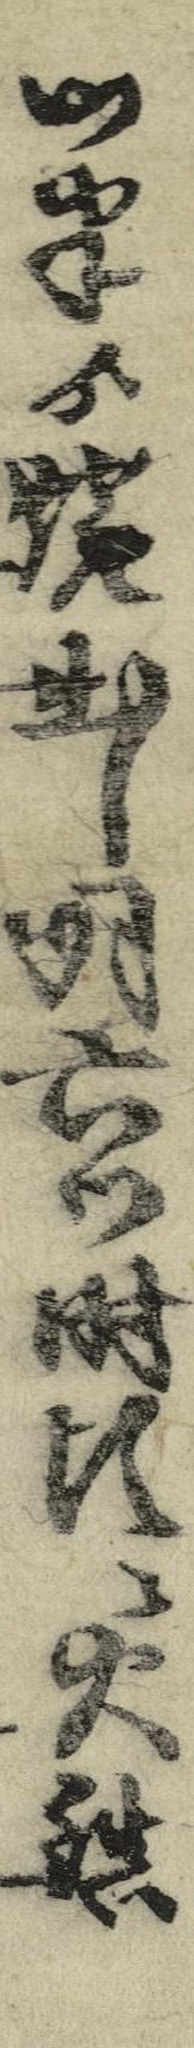ツ半ゟ焼出し明六ツ時頃に火鎮
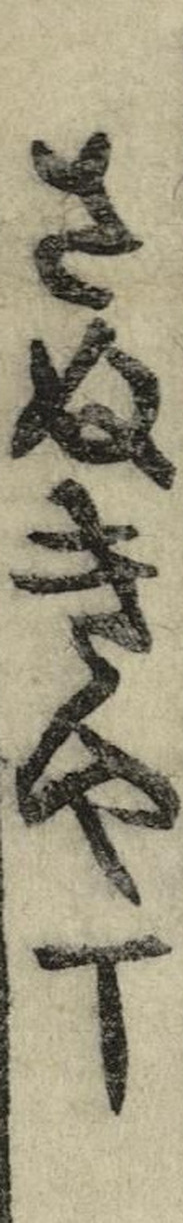さぬきや丁
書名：のこらず本しらべ大阪　大火細見本しらべ
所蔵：東京大学地震研究所図書室 Earthquake Research Institute Library, The University of Tokyo, JAPAN
